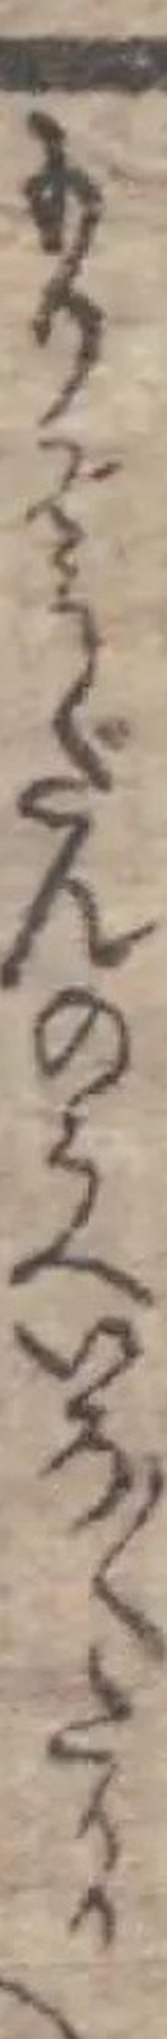もりそうだんのうへいろ〳〵たから
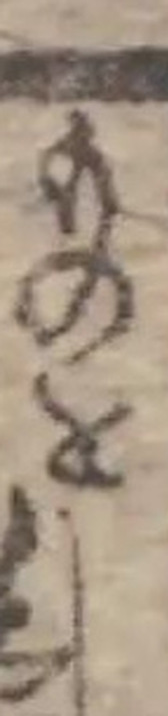ものを
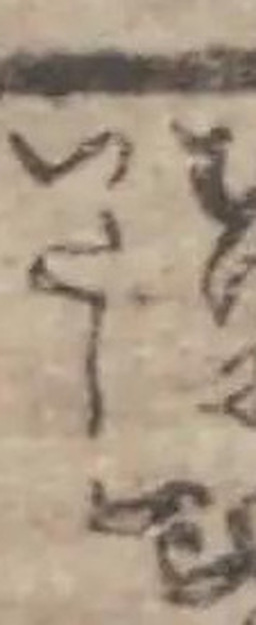いたし
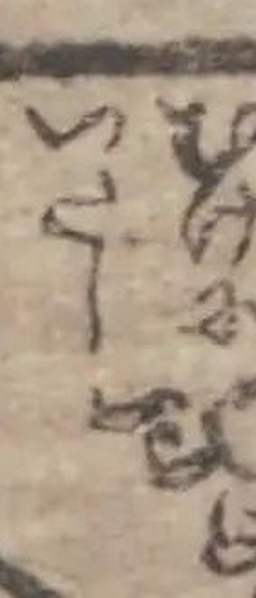いたし
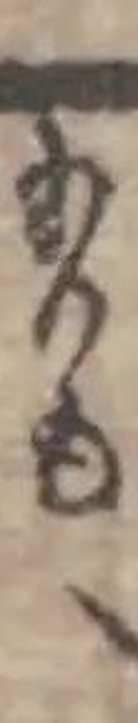もりも
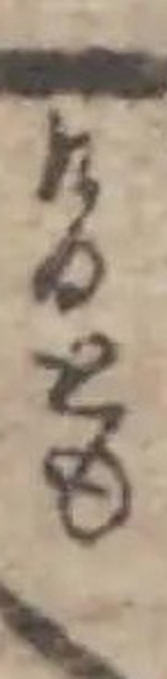けるとも
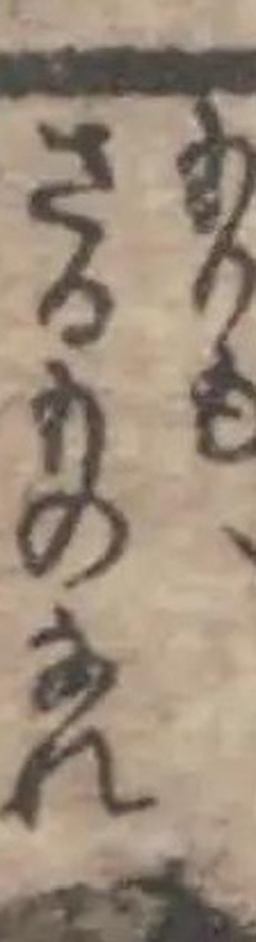さるものなれ
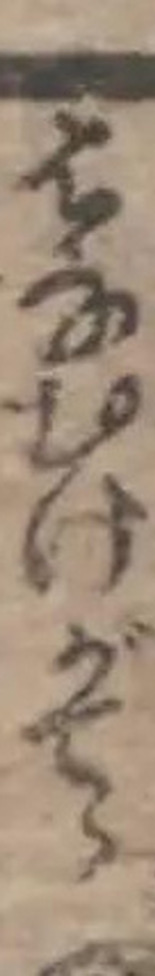はなむけがてら
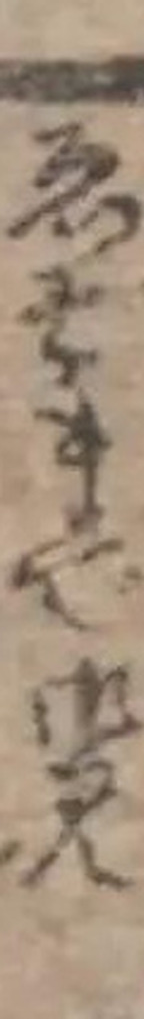ゑぞまで御見
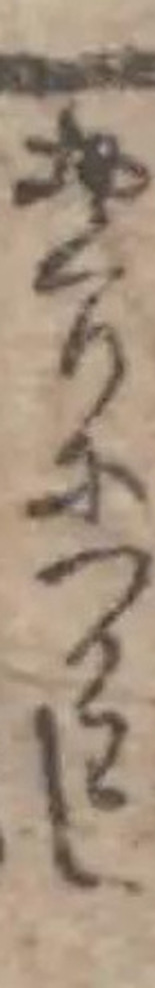おくりにつかわし
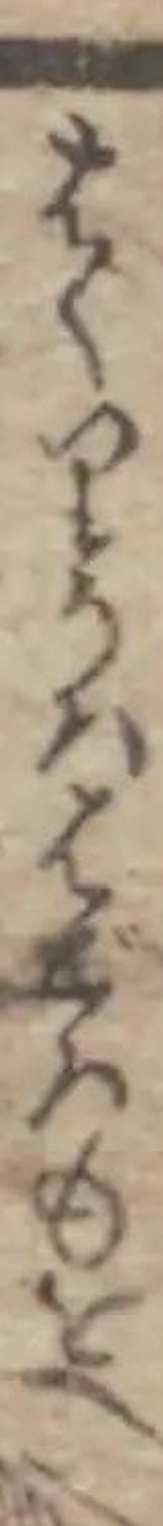はくりうハはごろもを
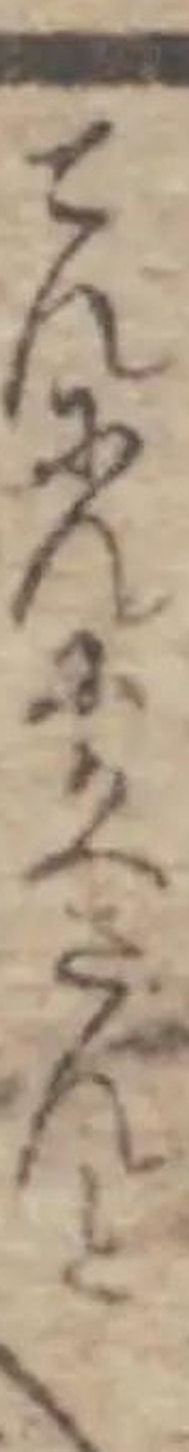てんにんにかへさんと
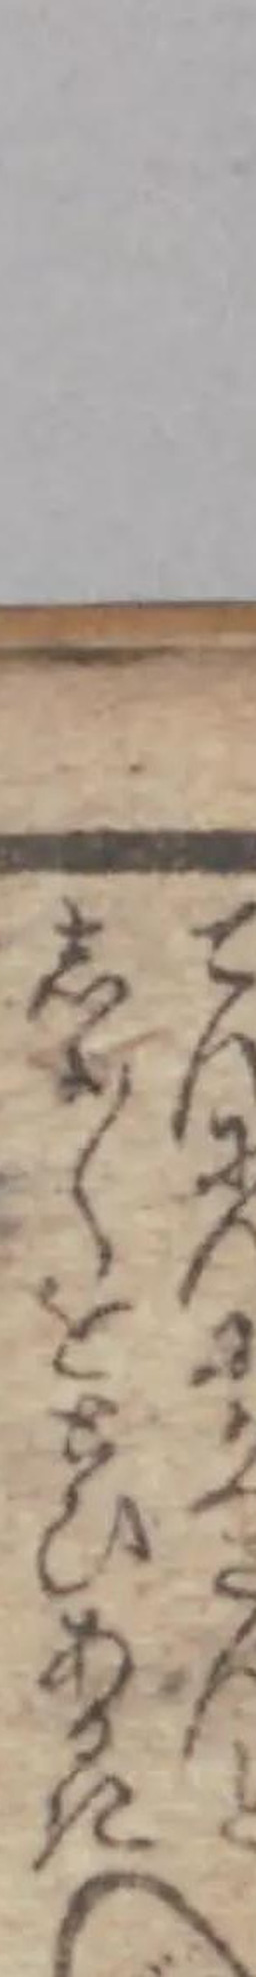しよ〳〵をとひあるき
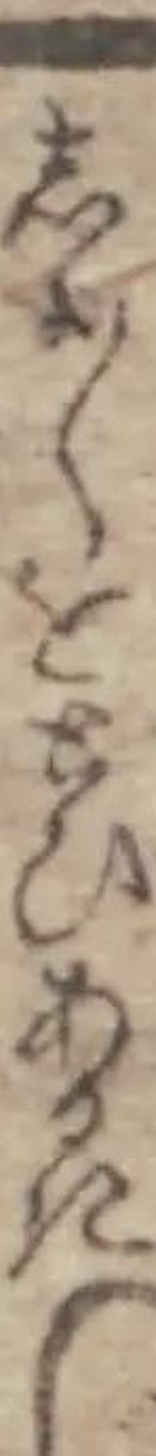しよ〳〵をとひあるき
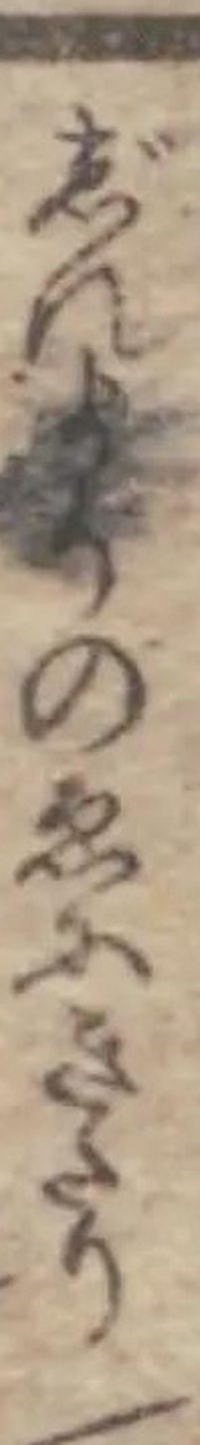じんよりのゑにきたり
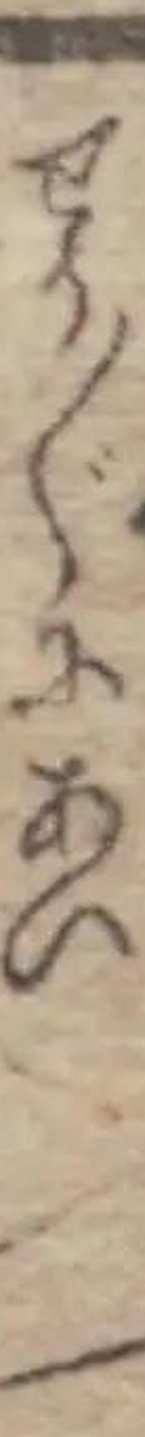せう〴〵にあい
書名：草紙の曙 3巻
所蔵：国立国会図書館 National Diet Library, JAPAN
